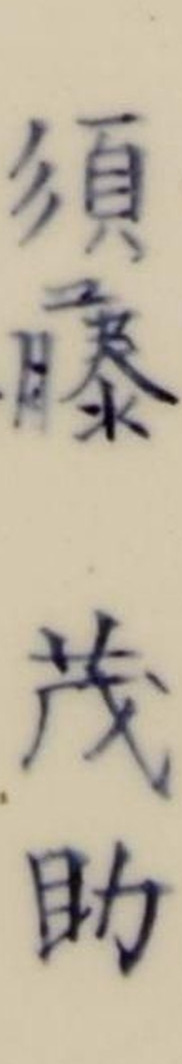須藤茂助
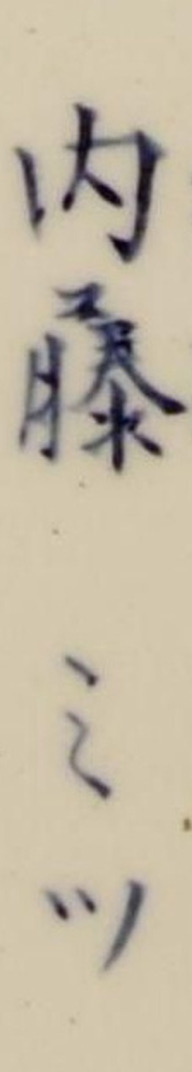内藤ミツ
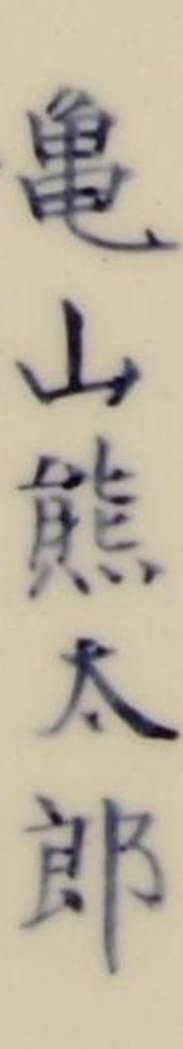亀山熊太郎
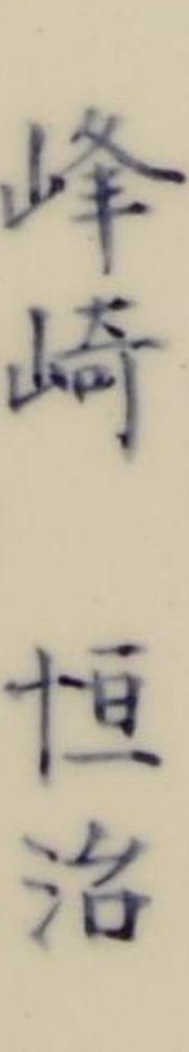峰崎恒治
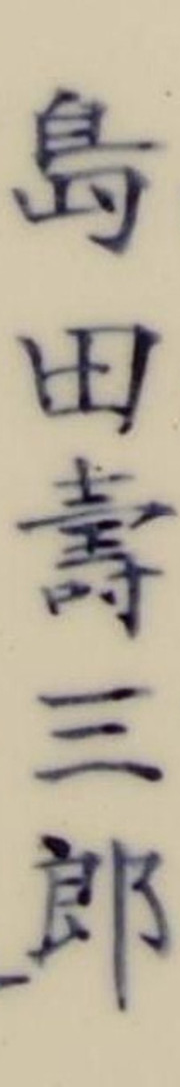島田寿三郎
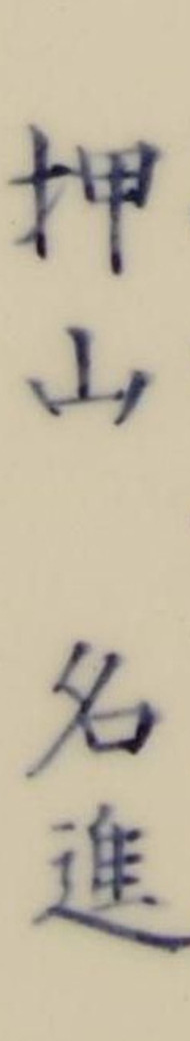押山名進
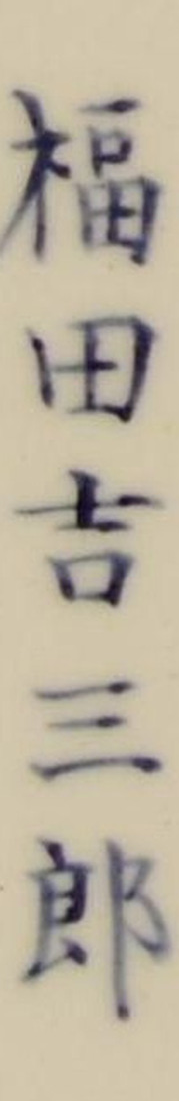福田吉三郎
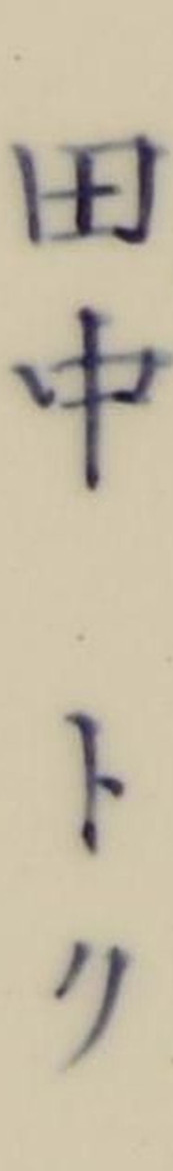田中トク
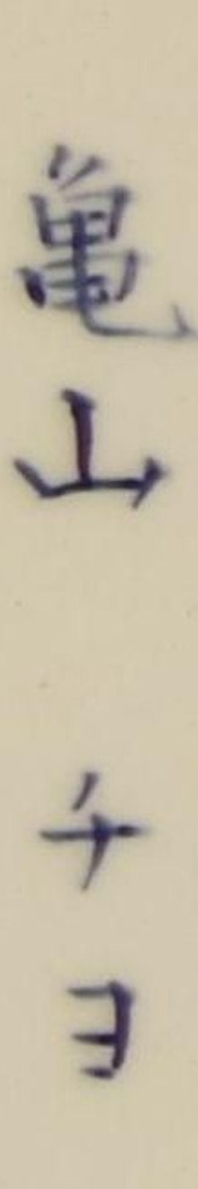亀山チヨ
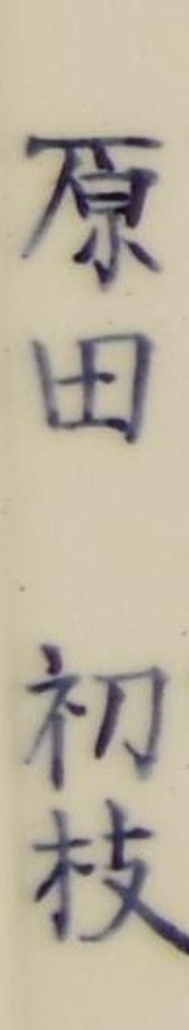原田初枝

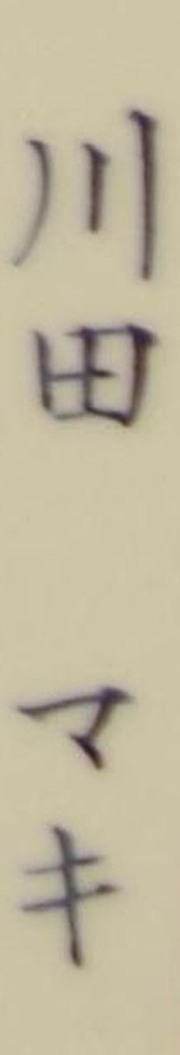川田マキ
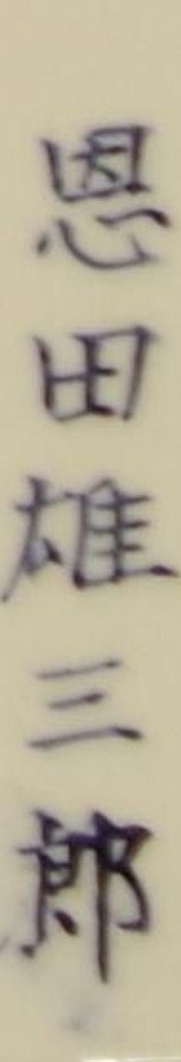恩田雄三郎
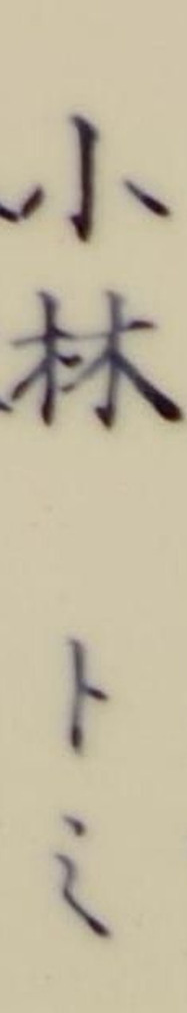小林トミ
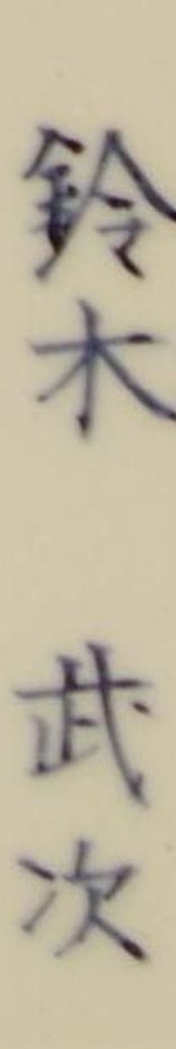鈴木武次
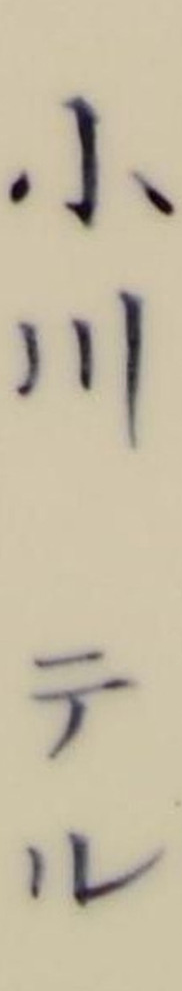小川テル
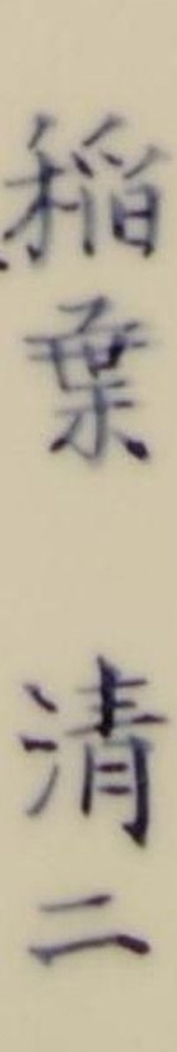稲葉清二
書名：E~L
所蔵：高野山金剛峯寺
